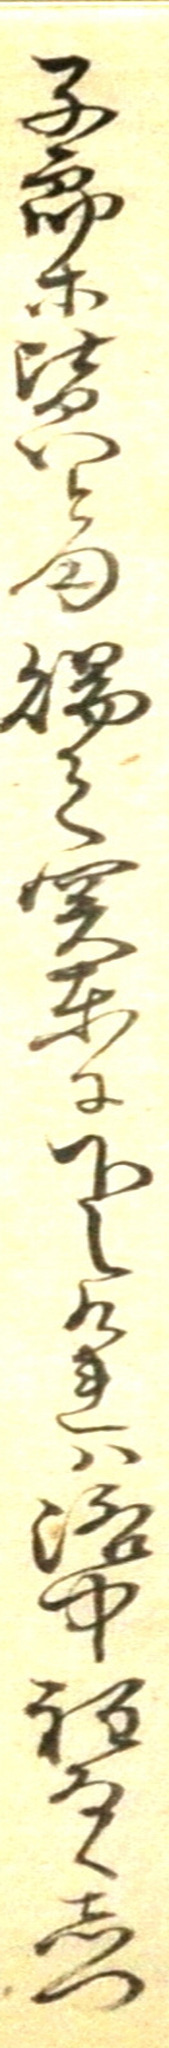子郎等皆いとま賜て関東に下しけれは洛中程なくしつ
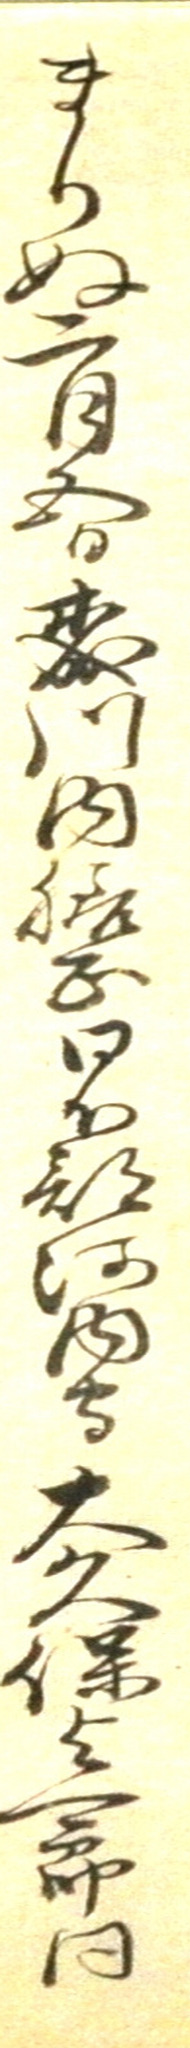まりぬ二月五日森川内膳正日下部河内守大久保与一郎同
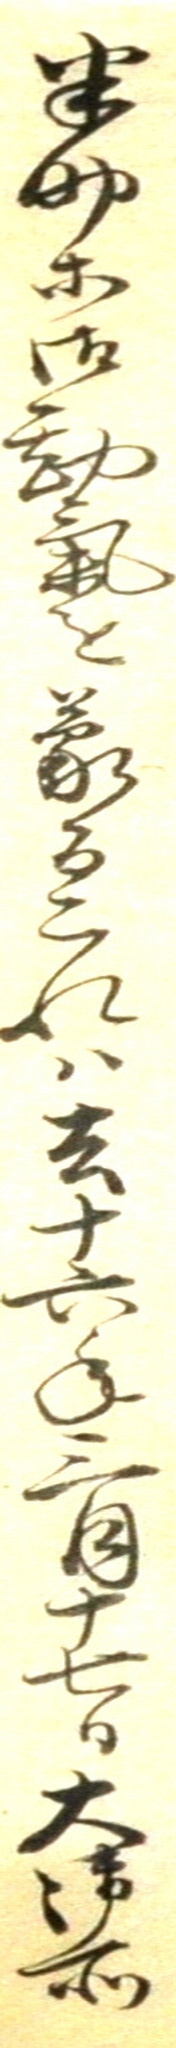半助等御勘気を蒙るこれは去十六年三月十七日大御所
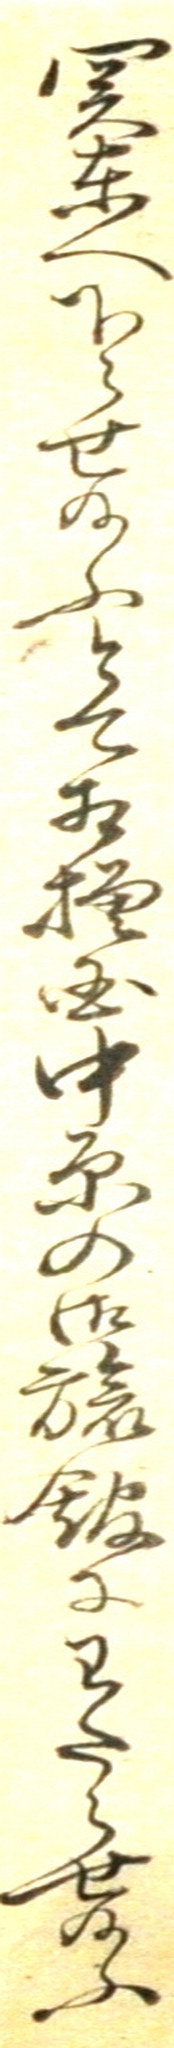関東へ下らせ給ふとて相模国中原の御旅館にわたらせ給ふ
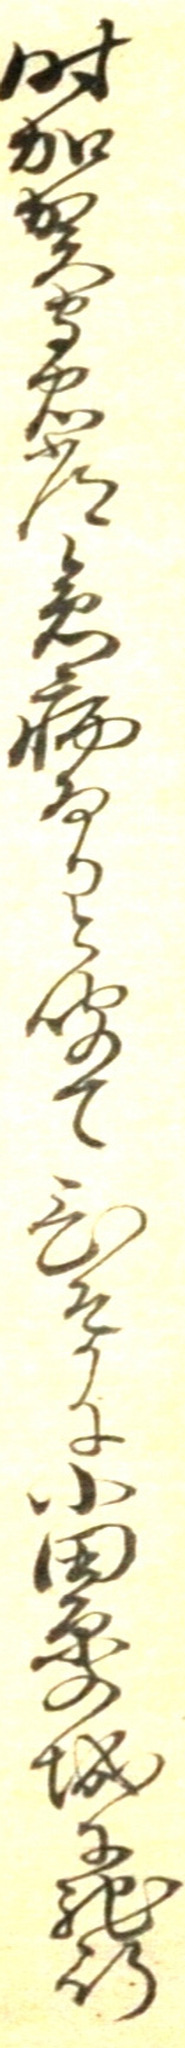時加賀守忠常急病なりと聞てひそかに小田原の城に馳行
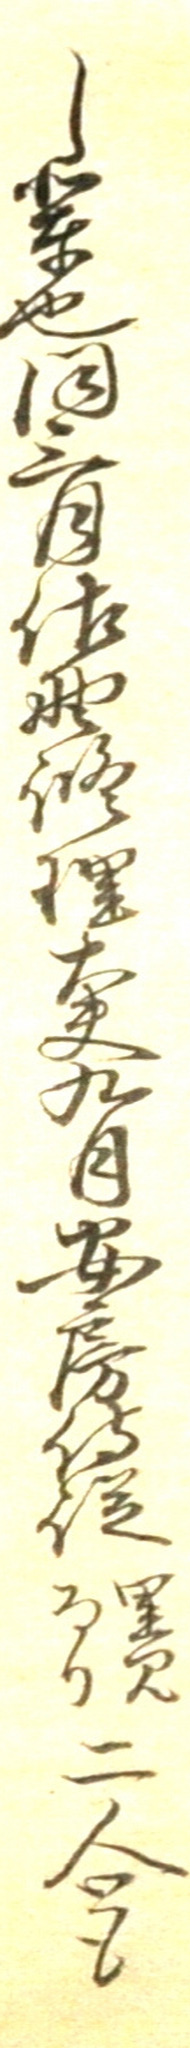し輩也三月佐野修理大夫九月安房侍従里見なり二人とも
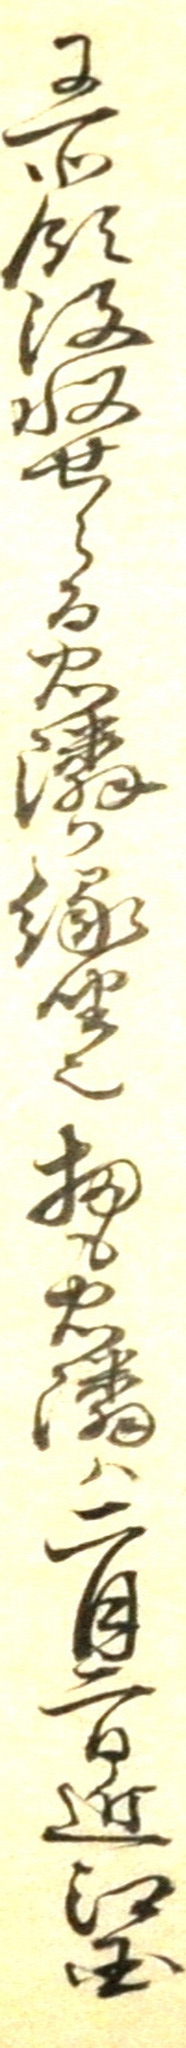に所領没収せらる忠隣か縁座也扨も忠隣は二月二日近江国
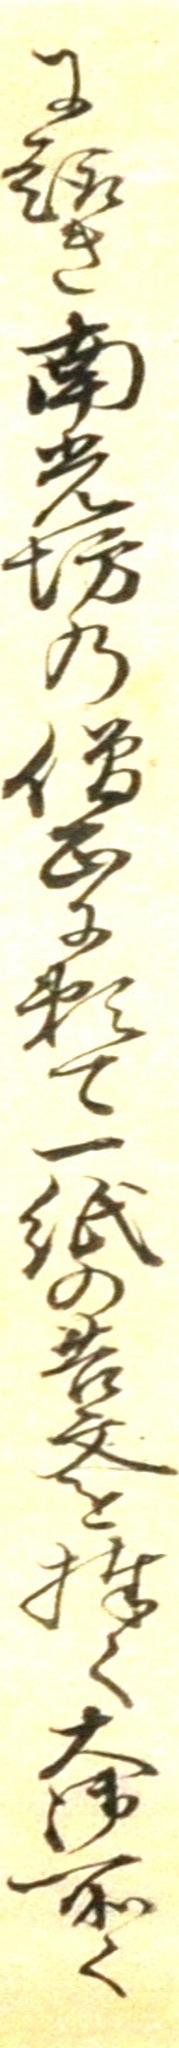に趣き南光坊の僧正に頼て一紙の告文を捧く大御所く
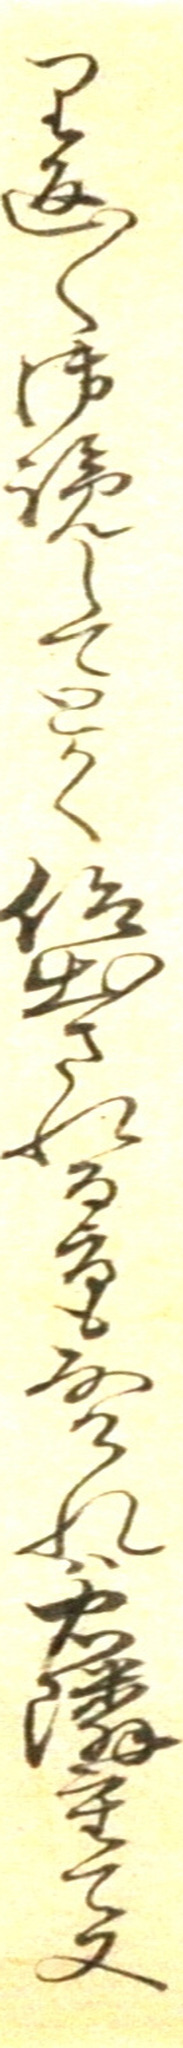り返〳〵御覧してとかく仰出される旨もなけれは忠隣重て又
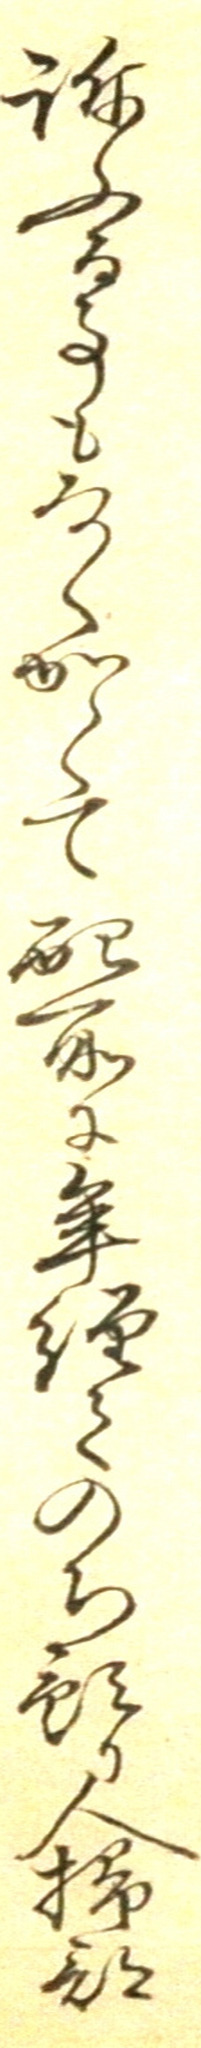訴ふる事もなくかくて配所に年経てのち預り人掃部
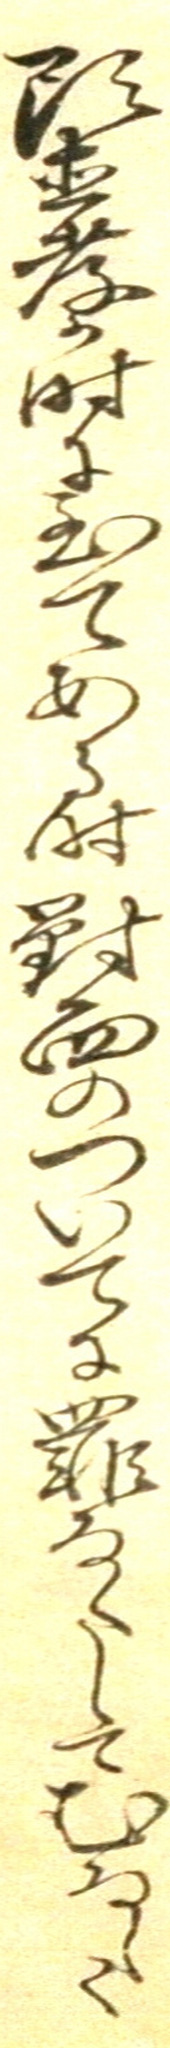頭直孝か時に至てある時対面のついてに罪なくしてむなしく
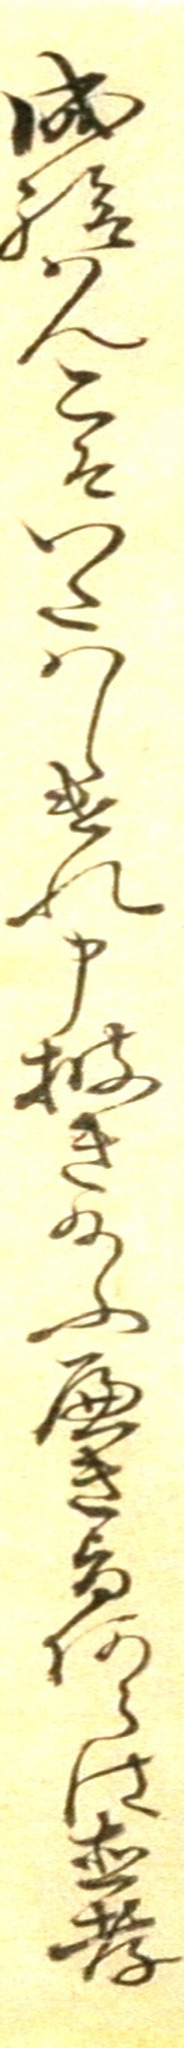成給はんこそいたはしけれ申披き給ふへき旨あらは直孝
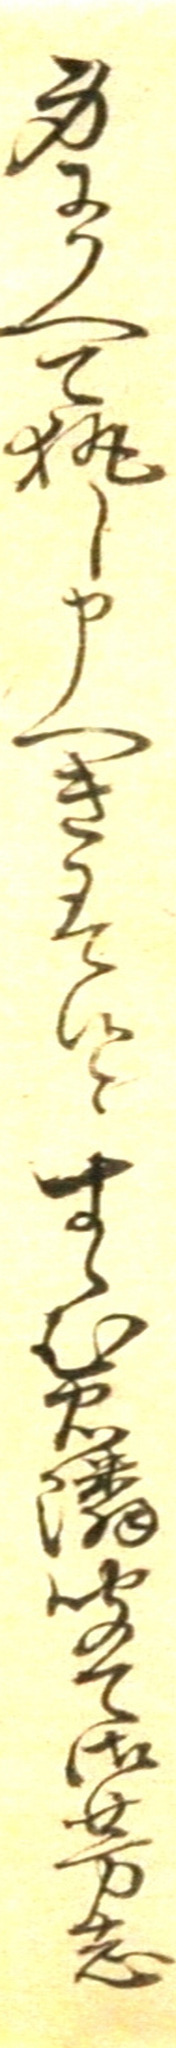身にかへて執し申へきにて候とすゝむ忠隣聞て御芳志
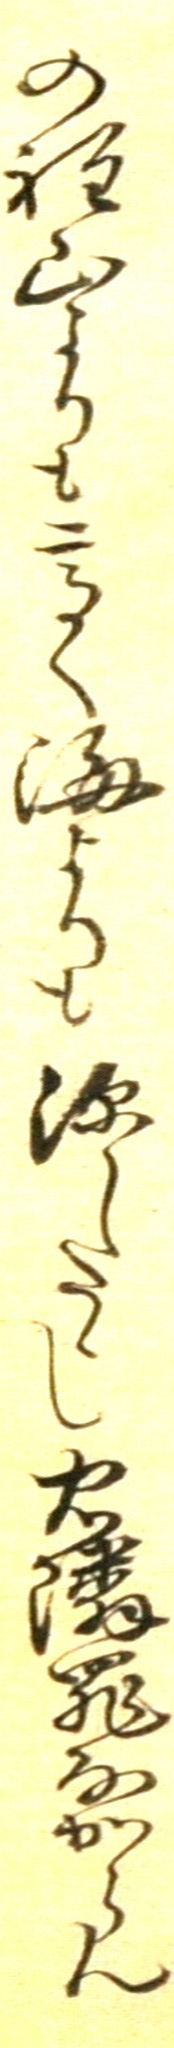の程山よりも高く海よりも深したゝし忠隣罪なからん

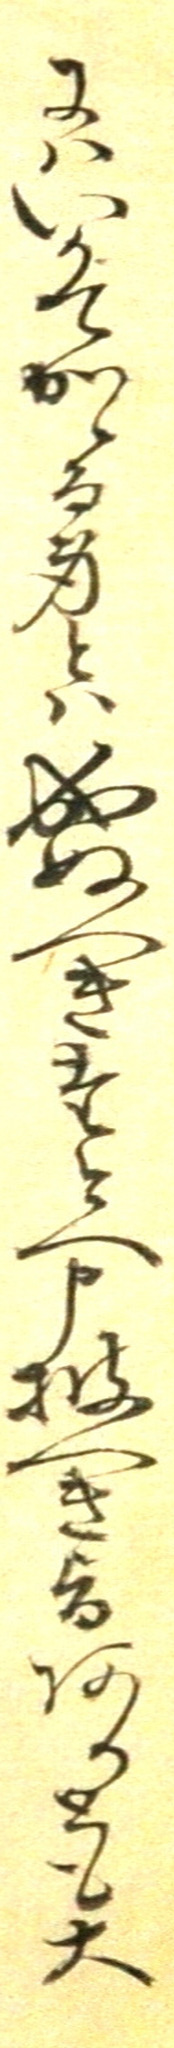にはいかてかゝる身とは成ぬへきたとへ申披へき旨ありとも大
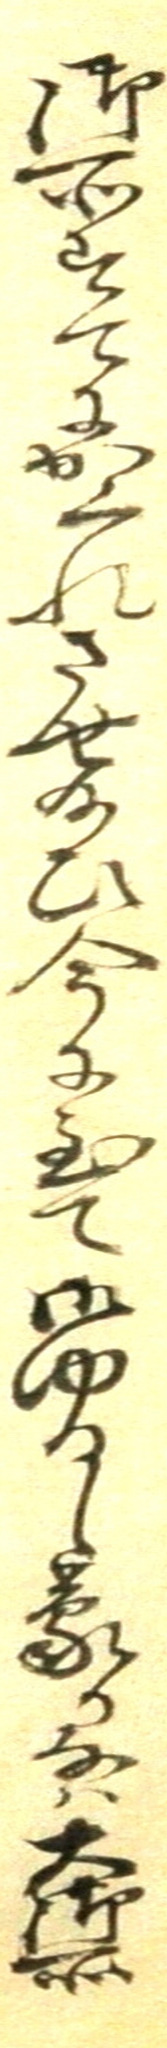御所すてにかくれさせ給ひ今に至て御ゆるし蒙りなは大御所
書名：藩翰譜（四・中）
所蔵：伊那市立高遠町図書館・合同会社AMANE
